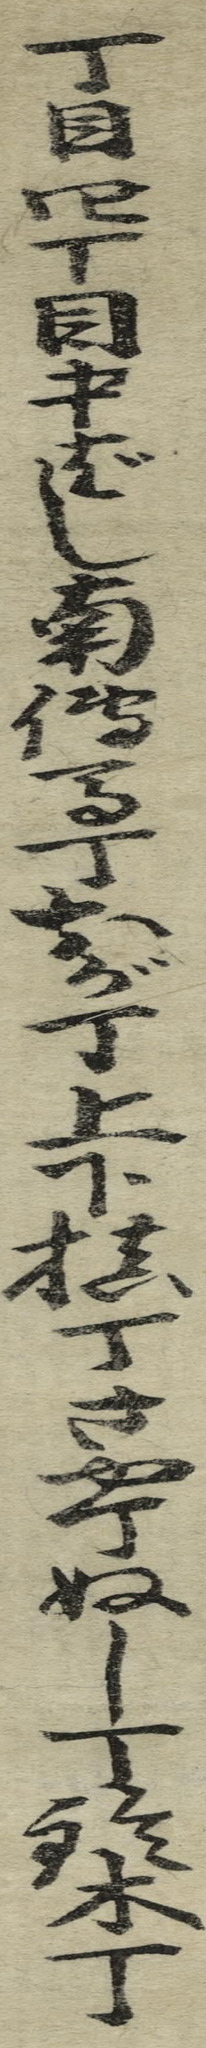丁目四丁目中ばし南傳馬丁おが丁上下槇丁さや丁ぬし丁鈴木丁
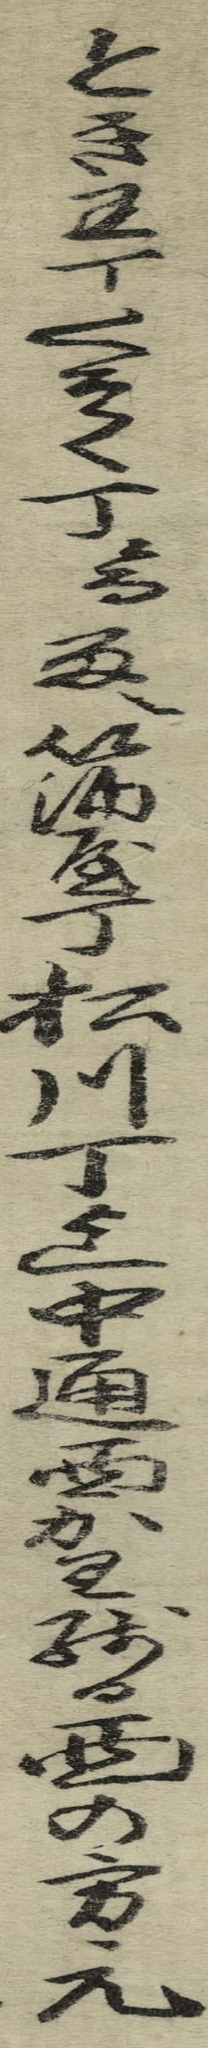ときわ丁くそく丁に而留ル箔屋丁松川丁迄中通西かわ残る西の方元
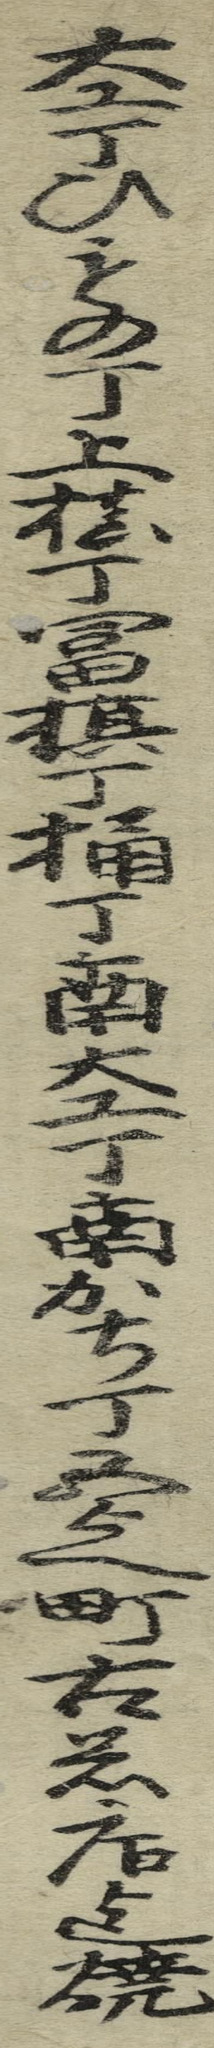大工丁ひもの丁上槇丁冨槇丁桶丁南大工丁南かち丁五郎へ町古着店迄焼
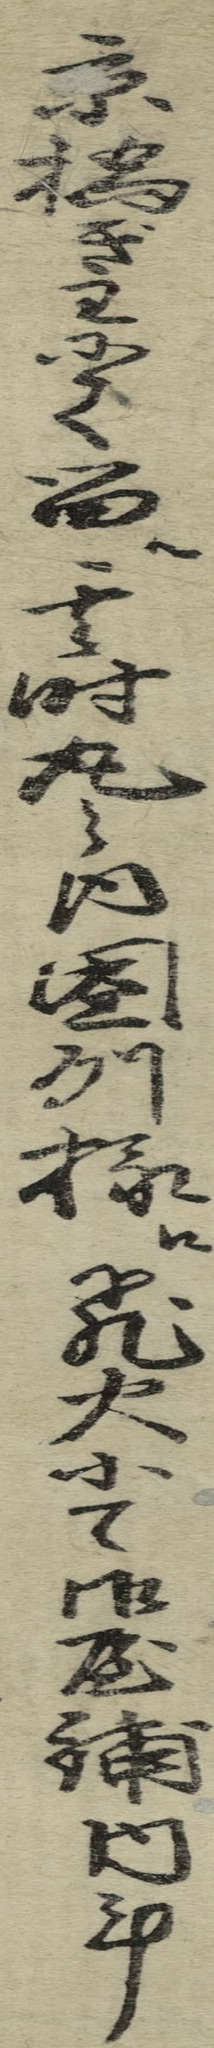京橋きわにて留ル其時丸の内因州様え飛火にて御屋鋪内斗
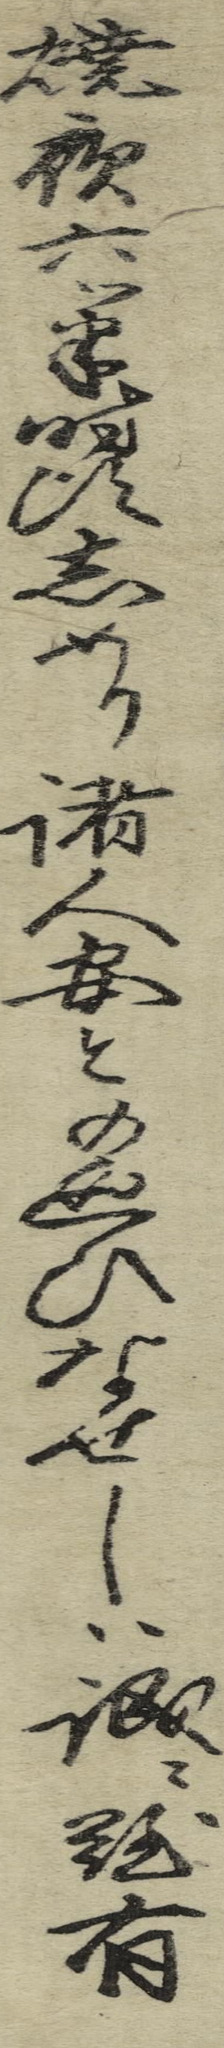焼夜六ッ半時頃しめり諸人安との思ひなせしは誠に難有
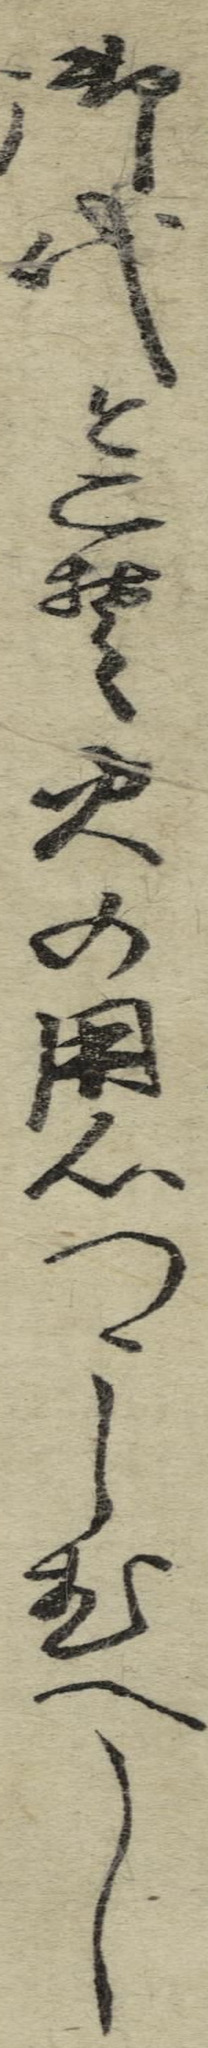御代とこそ火の用心つゝしむへし
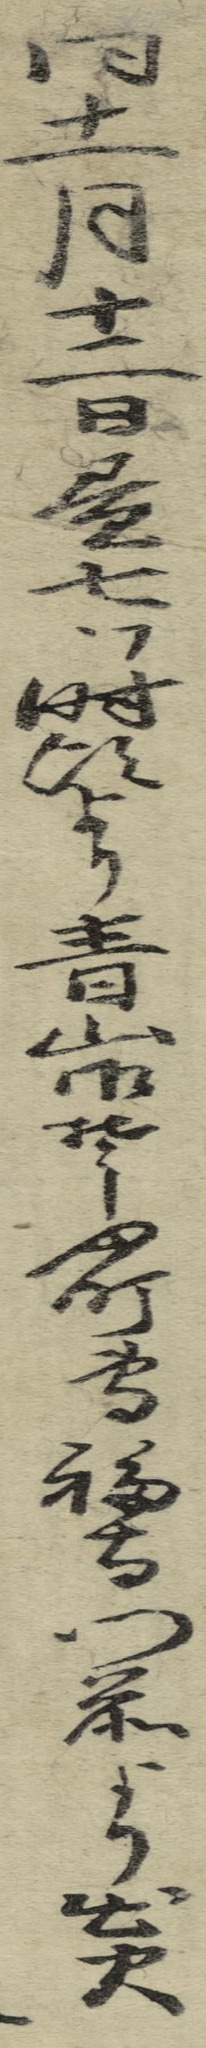同十一月十二日昼七ッ時頃より青山御そふ町専福寺門前より出火
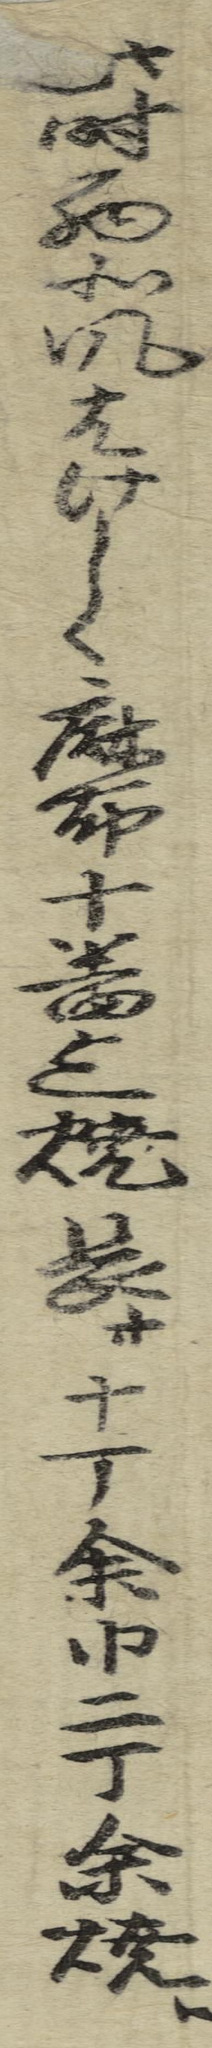此時西北風はけしく麻布十番迄焼長サ十丁余巾二丁余焼ル
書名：安政五午十一月十五日焼場方角附
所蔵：東京大学地震研究所図書室 Earthquake Research Institute Library, The University of Tokyo, JAPAN
